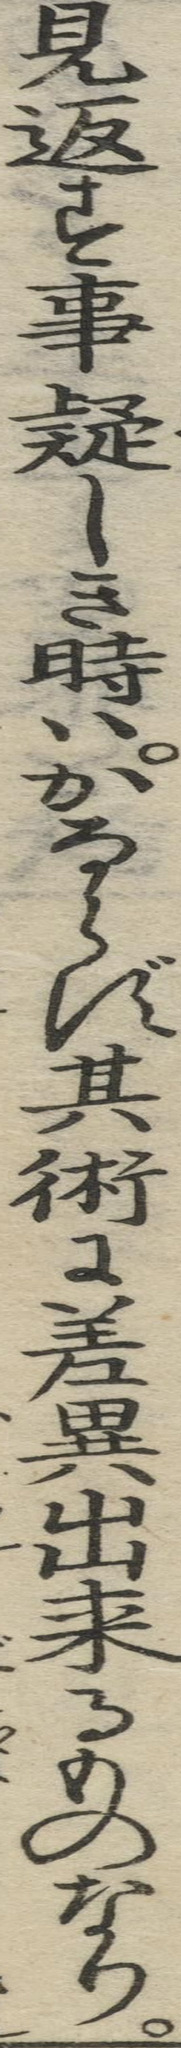見返す事疑しき時は。かならず其術に差異出来るものなり。
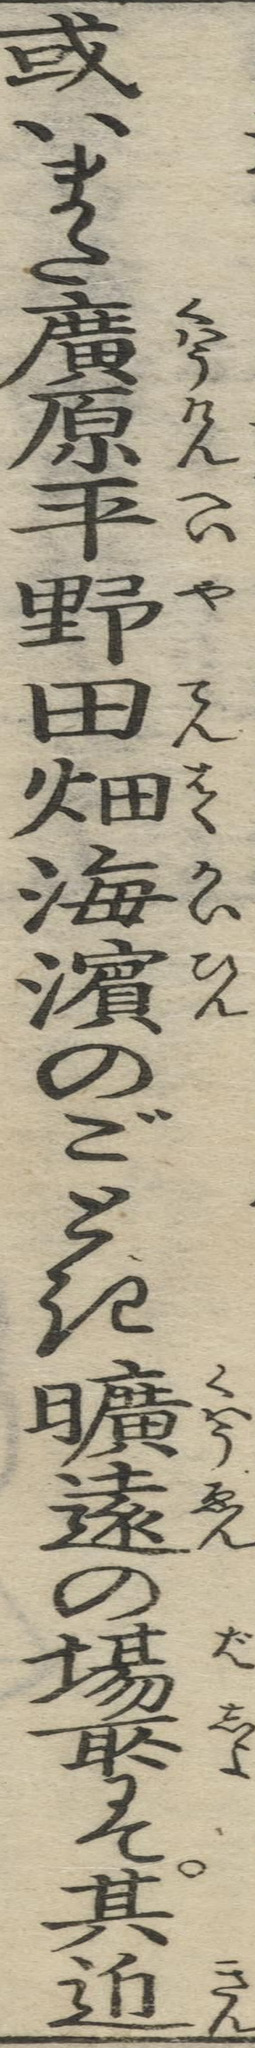或はまた広原平野田畑海浜のごとき嚝遠の場所にて。其近
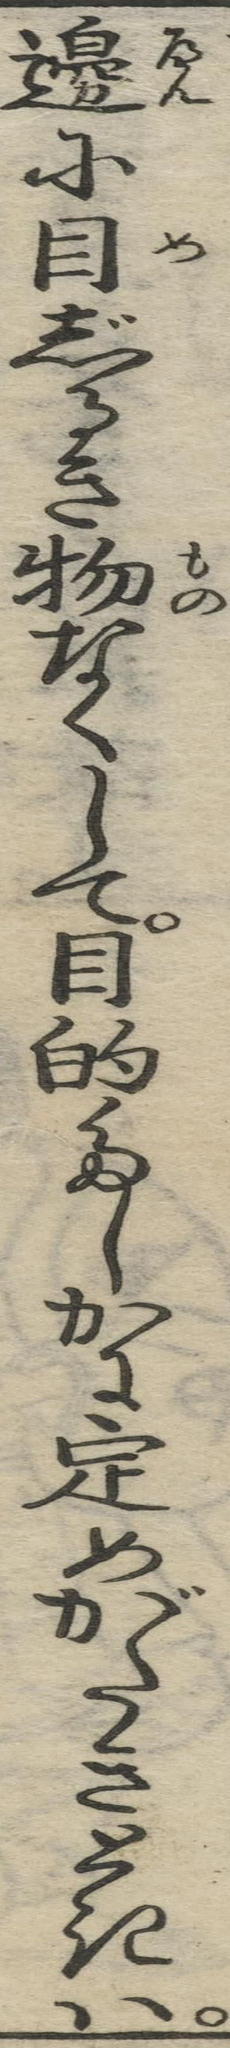辺に目じるき物なくして。目的たしかに定めがたきときは。
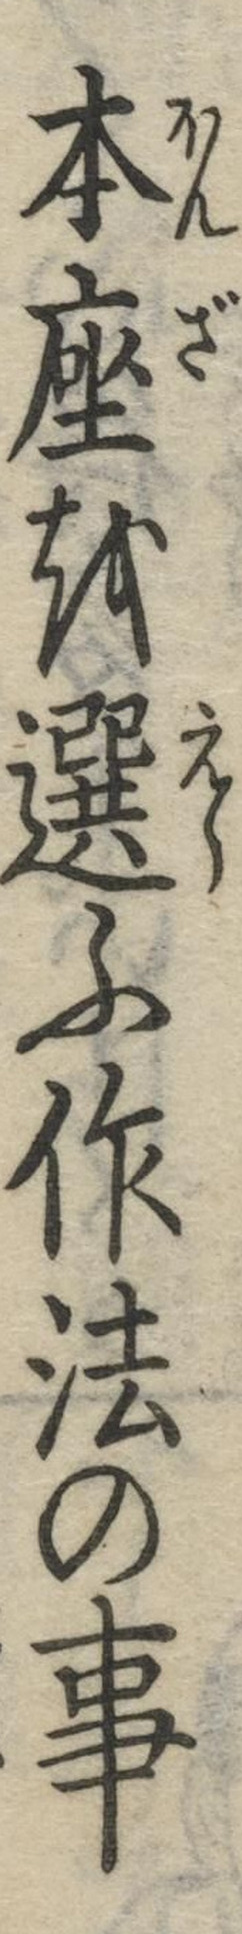本座を選ふ作法の事
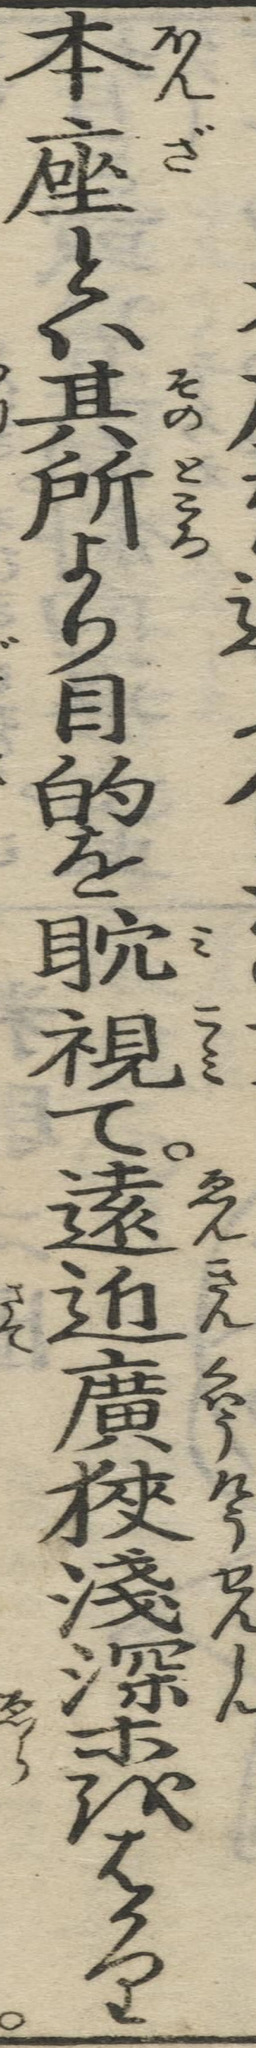本座とは其所より目的を耽視て。遠近広狭浅深等をはかり
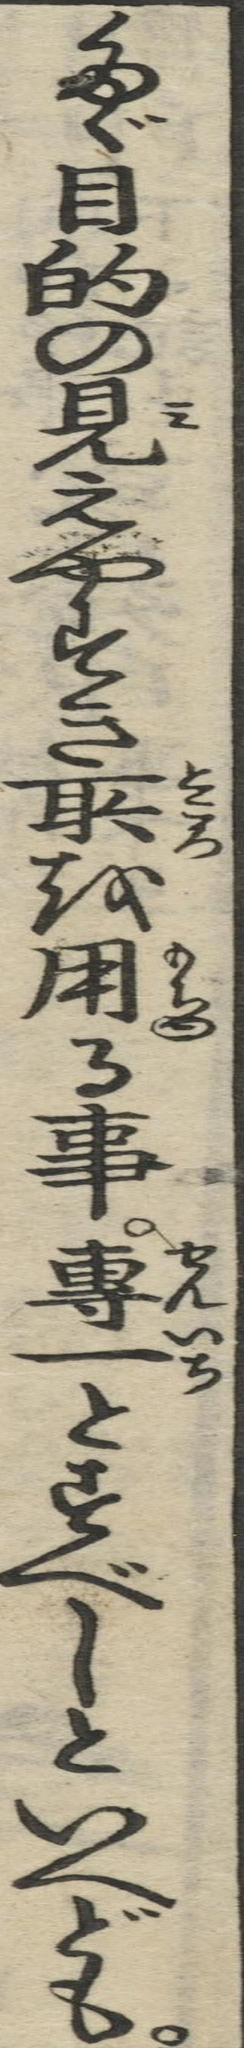たゞ目的の見えやすき所を用る事。専一とすべしといへども。
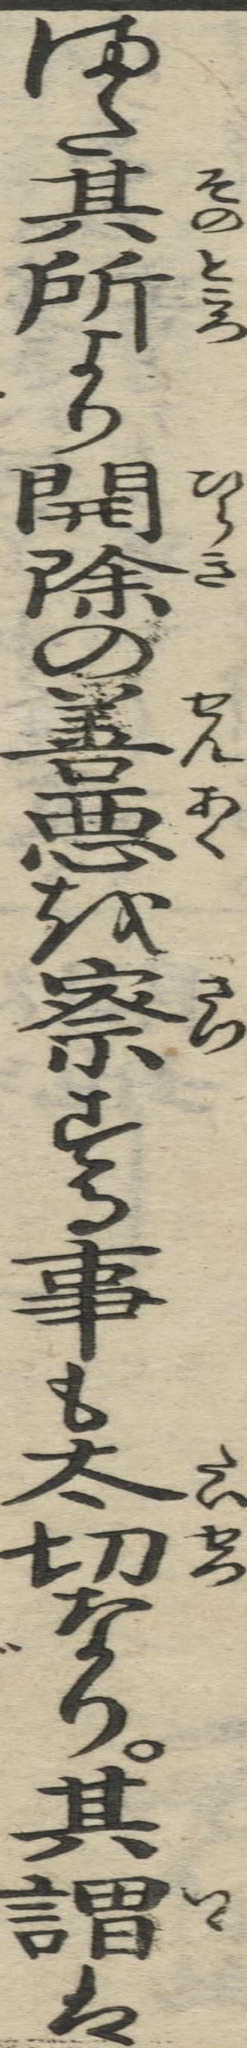また其所より開除の善悪を察する事も大切なり。其謂は
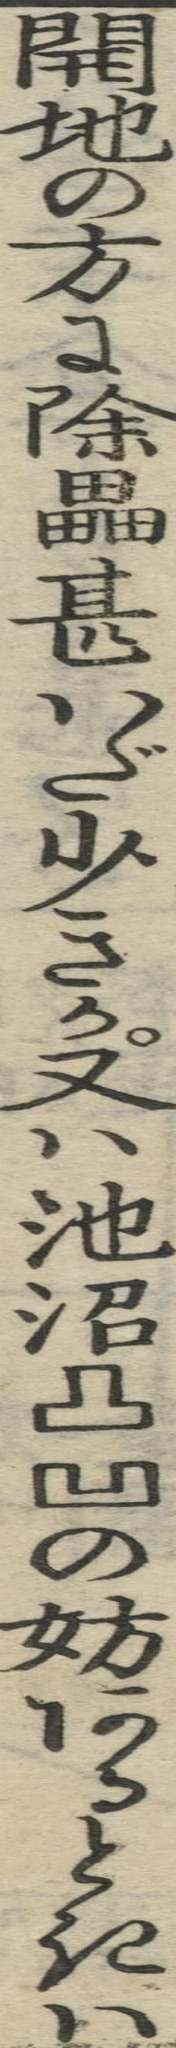開地の方に除畾甚はだ少きか。又は池沼凸凹の妨あるときは。
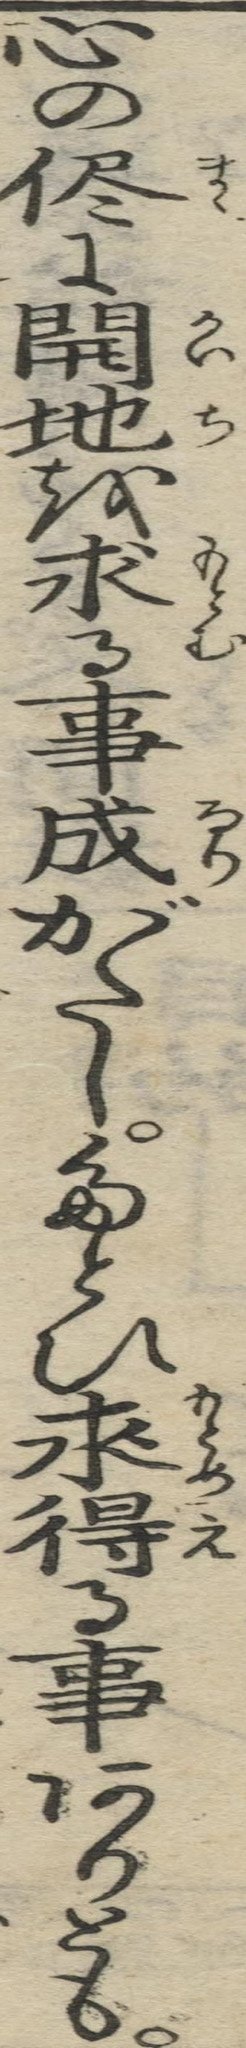心の侭に開地を求る事成がたし。たとひ求得る事ありとも。
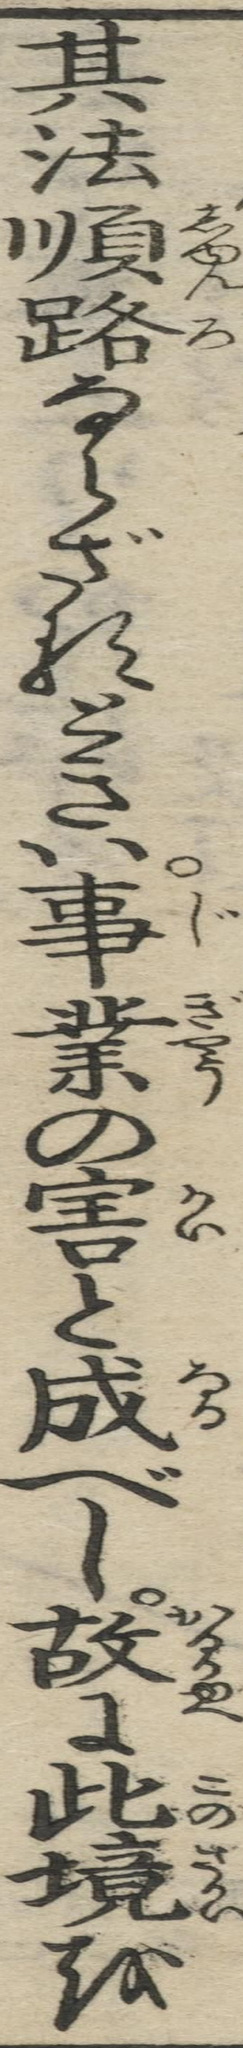其法順路ならざるときは。事業の害と成べし。故に此境を
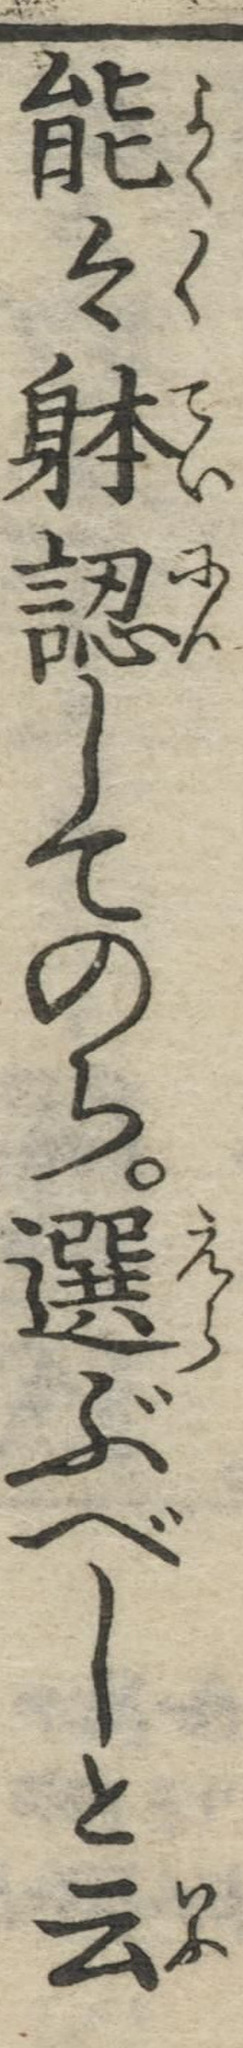能々体認してのち。選ぶべしと云
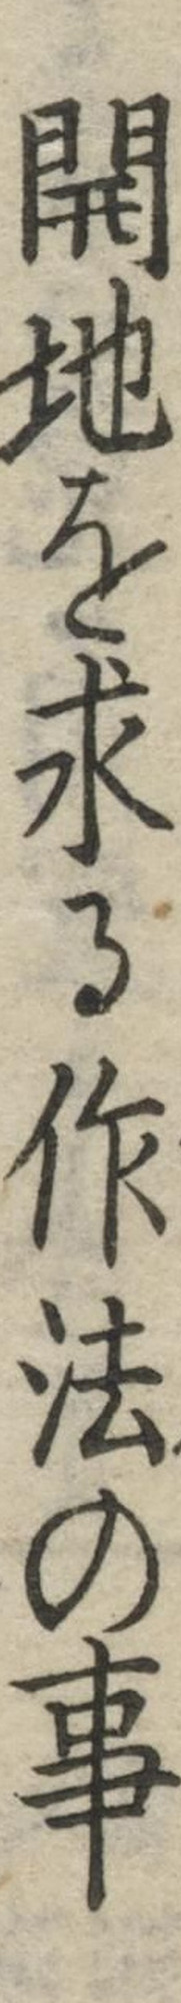開地を求る作法の事
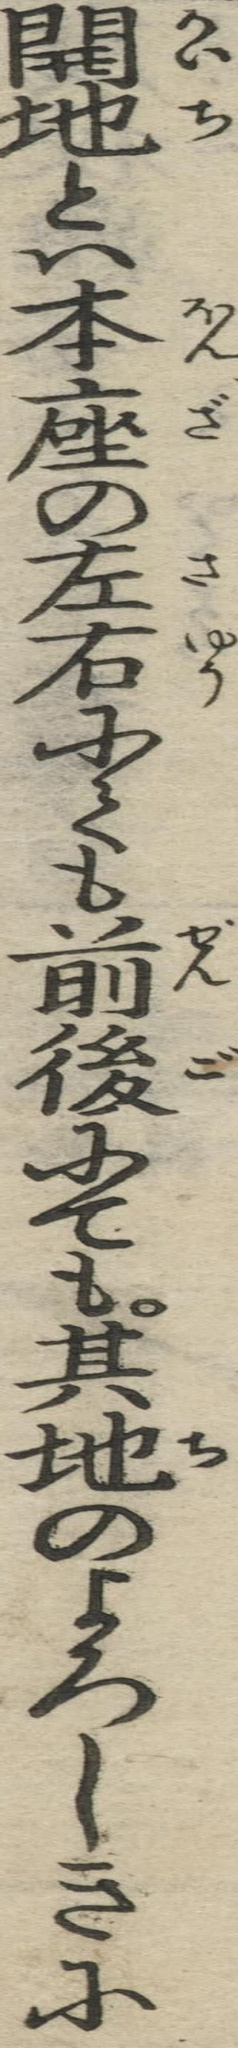開地とは本座の左右にても前後にても。其地のよろしきに
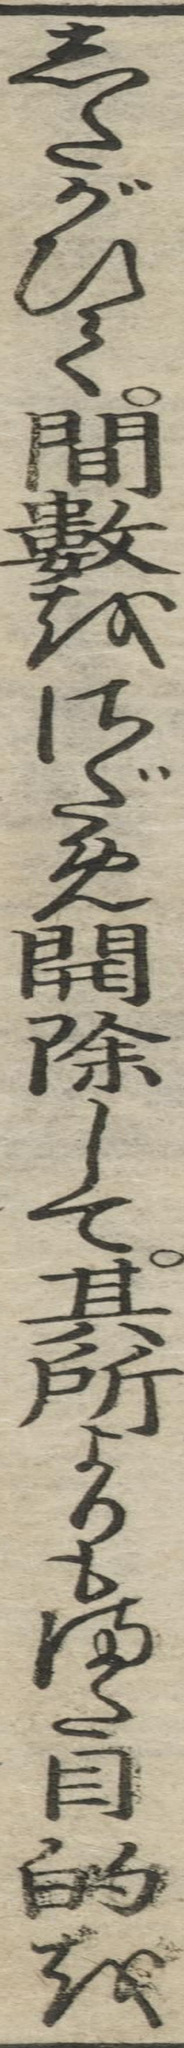したがひて。間数をさだめ開除して。其所よりもまた目的を
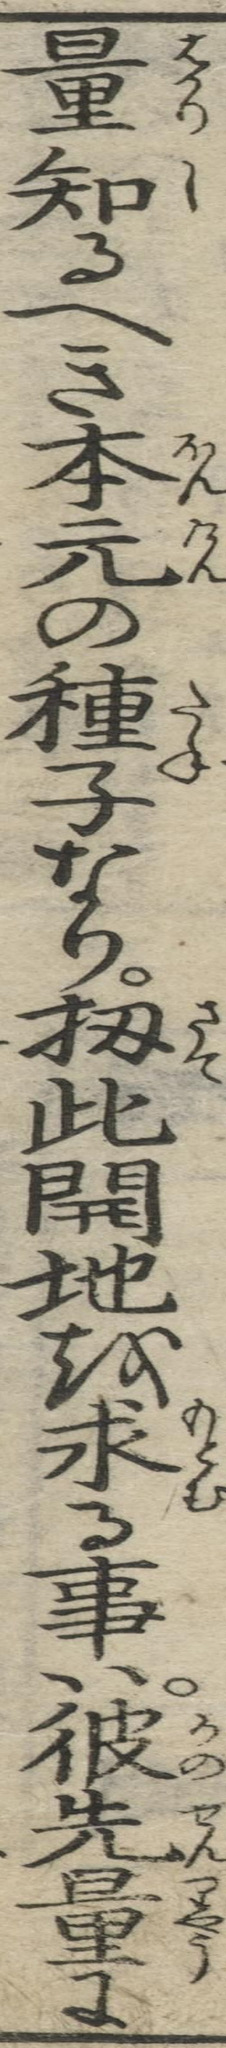量知るへき本元の種子なり。扨此開地を求る事は。彼先量に
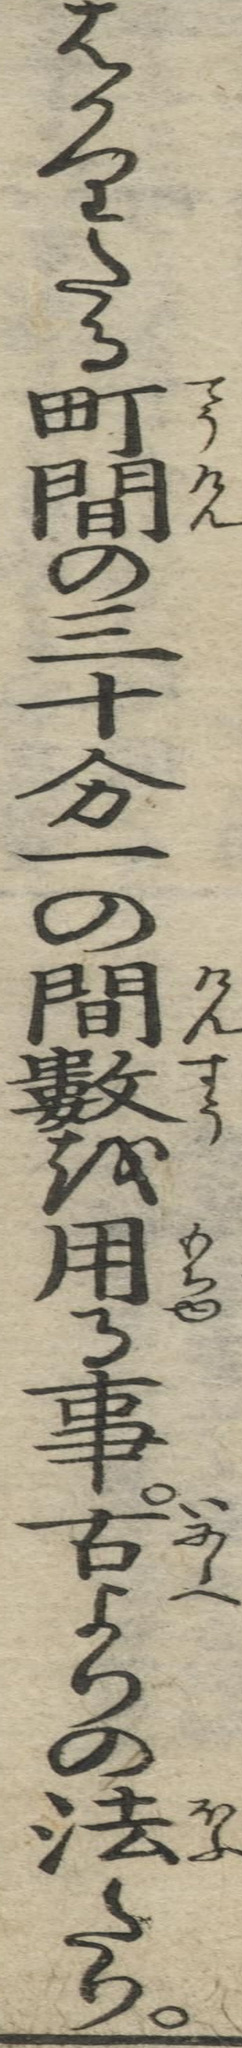はかりたる町間の三十分一の間数を用る事。古よりの法たり。
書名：量地指南　巻之一（内題）
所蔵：東京大学地震研究所図書室 Earthquake Research Institute Library, The University of Tokyo, JAPAN
